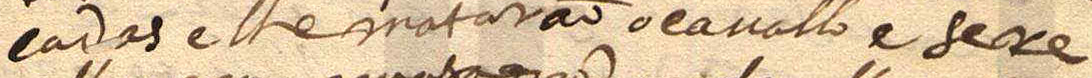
cadas e lhe mataraõ o cauallo e se re
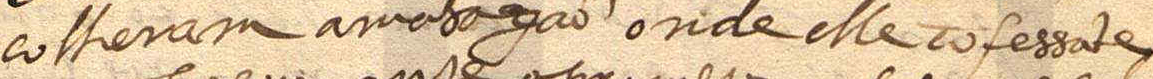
colheram a mazagaõ onde elle c̄ofessāte
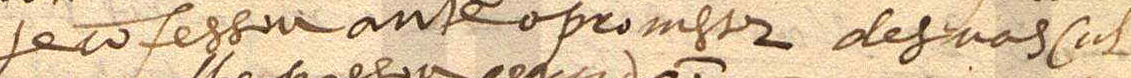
se c̄ofessou ante o prouisor de suas Cul
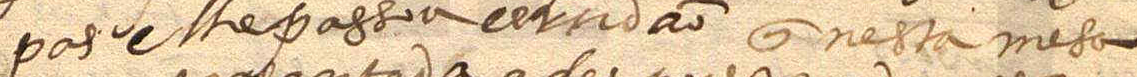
pas e lhe passou certidaõ q̄ nesta mesa
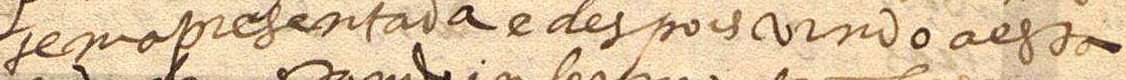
tem apresentada e despoes vindo a esta
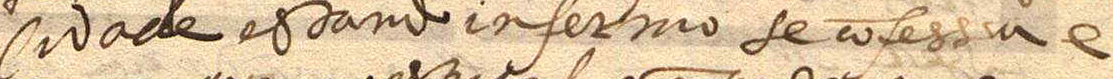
Cidade estando infermo se c̄ofessou e
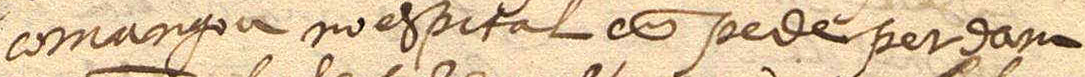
comungou no espital e q̄ pede perdam
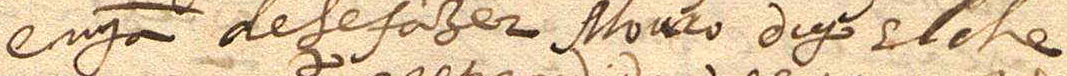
e mj̄a de se fazer Mouro digo Elche
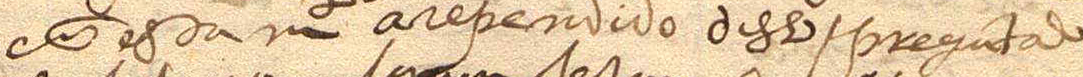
e q̄ esta mto arependido disso / pregūtado
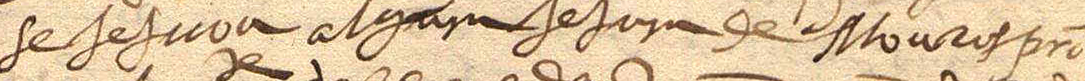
se JeJuou algum JeJum de Mouros prī
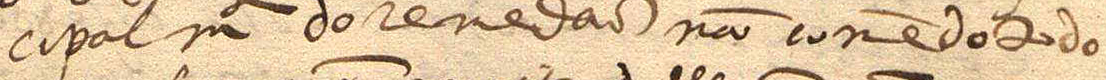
cipalmte do remedaõ não comēdo todo
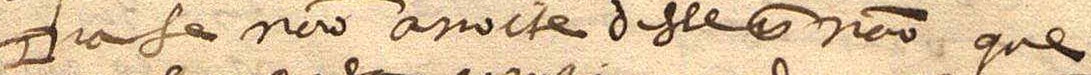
Dia senaõ a noite disse q̄ não que
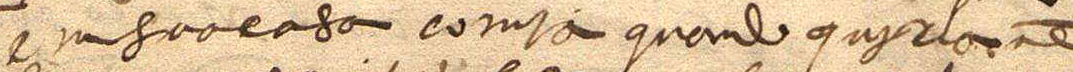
em sua casa comja quando qujria nē
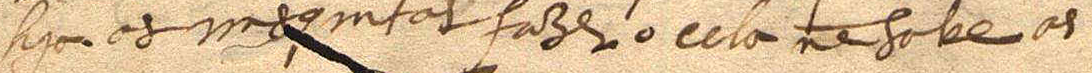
hja as mesquitas fazer o cela nē sabe as
